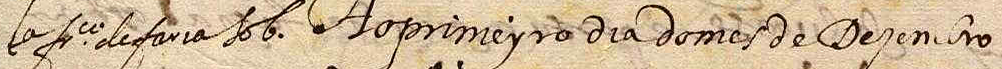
ta fr.co de faria sob. Ao primeyro dia do mes de Dezembro
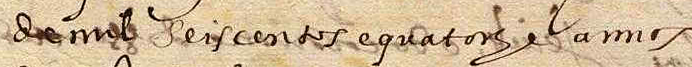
de mil seiscentos e quatorze annos
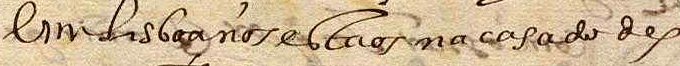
em lisboa nos estaos na casa do des
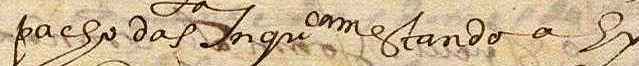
pacho da sta Inquçam estando ahy
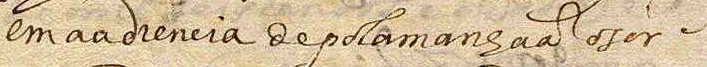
em audiencia de pola manhaā o sor̄
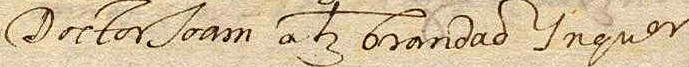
Doctor Ioam al̄z brandaõ Inquor
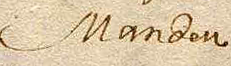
Mandou
